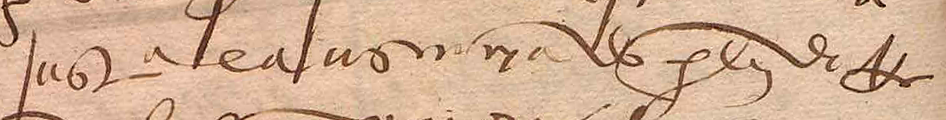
Justa e ausencya do ꝑ̄dor da Re
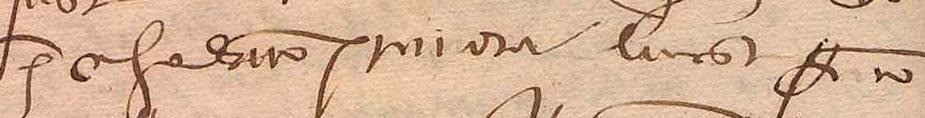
p̄sa ho dito promotor deu este fcto
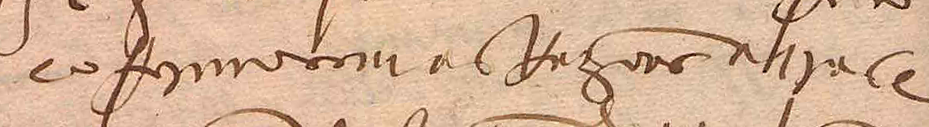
e ofereceo com as Rezões atras e
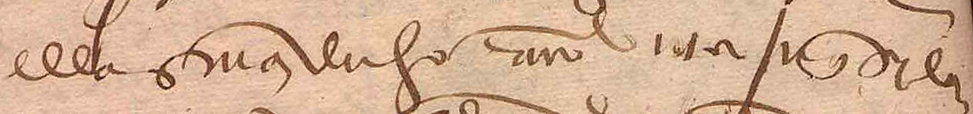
dellas mādou ho dito doutor Jnq̄sydor
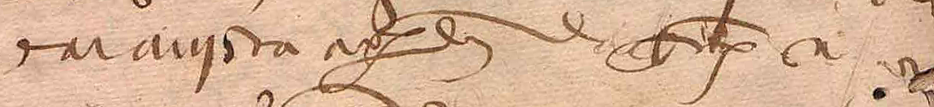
dar a ujsta ao ꝑ̄dor da Re ꝑsa Jor
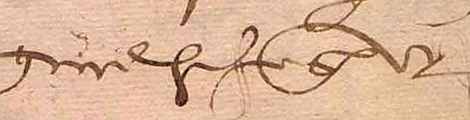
ge coelho ho sp̄vy
